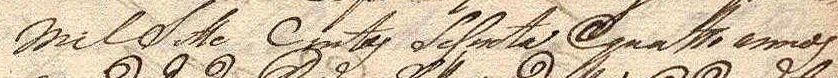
mil SetteCentos Sesenta e quatro annos
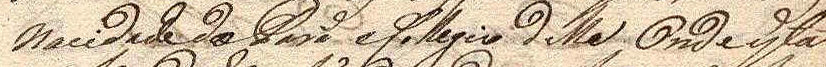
na cidade do Parà e Collegio della Onde esta
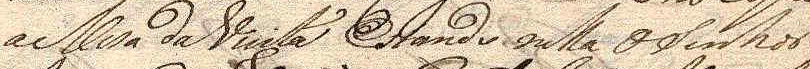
a Mesa da Visita Estando nella o Senhor
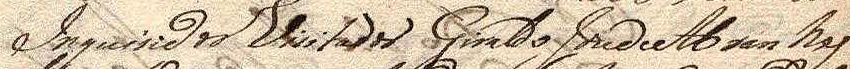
Inquisidor Visitador Giraldo Joze de Abrantes
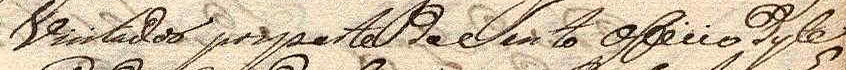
Visitador por parte do Santo officio deste
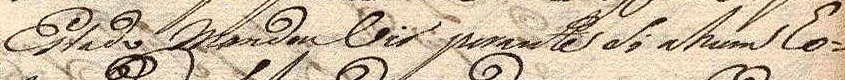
Estado mandou vir perante si a hum ho
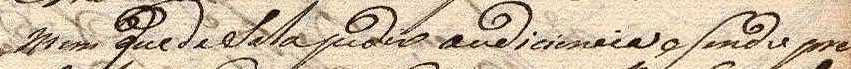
mem que de Sala pedio audiciencia, e sendo pre
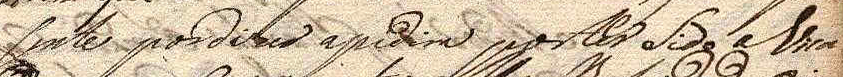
sente por dizer a pedira por ter sido aVisa
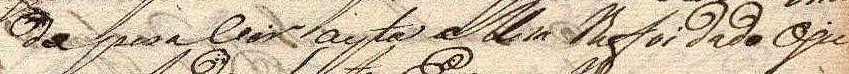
da para vir a esta Mesa lhe foi dado O ju
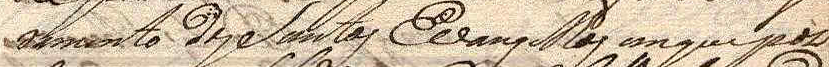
ramento dos Santos Evangelhos em que poz
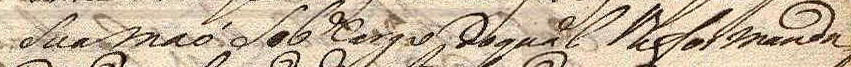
sua maõ Sob cargo do qual lhe foi manda
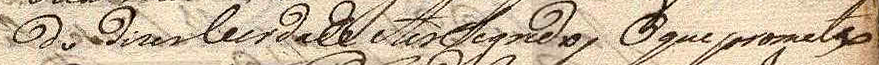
do dizer verdade e ter segredo O que prometeo
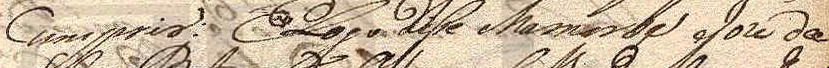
Cumprir: E Logo disse chamarse Iozé da
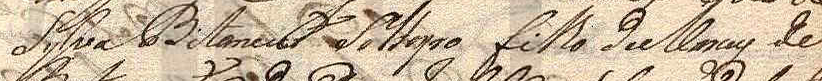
Sylva Bitancur Solteyro filho de Marcus de
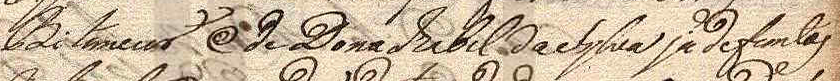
Bitancur e de Dona Izabel da Sylua ja defuntos
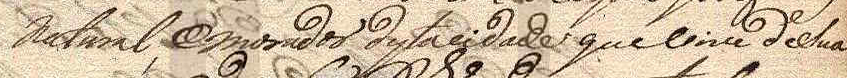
natural, e morador desta cidade que viue de Sua
